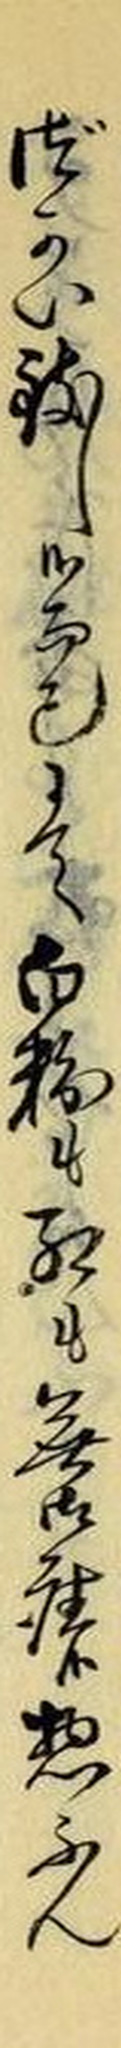だらい致し候而己にて白粉も紅も無御座候惣ふん
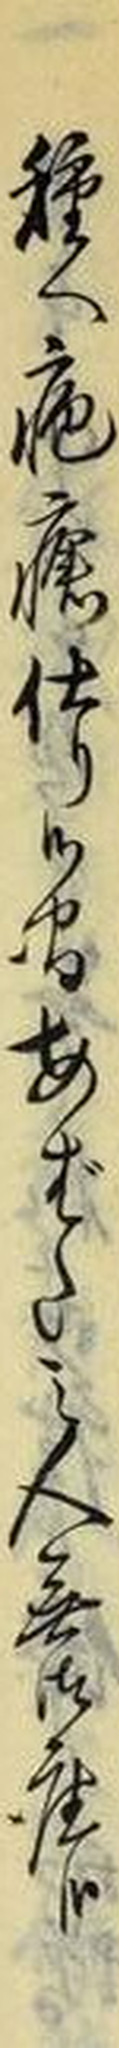種へ施療仕り候間あばた之人無御座候
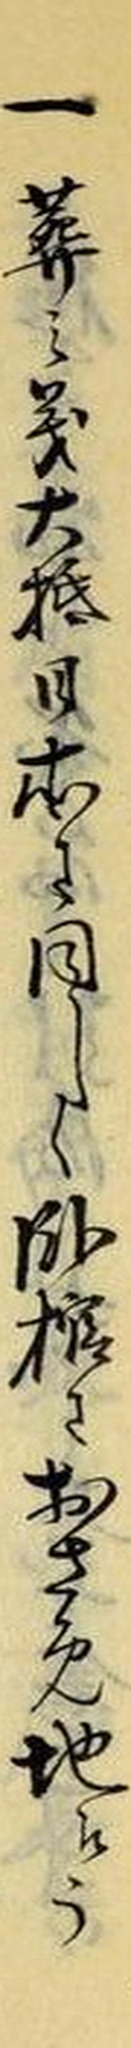一葬之義大抵日本に同しく臥棺におさめ地江う
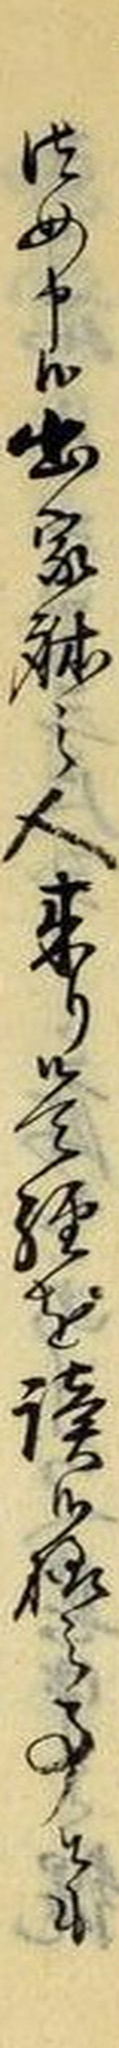すめ申候出家躰之人来り候て経を読候様之事とも
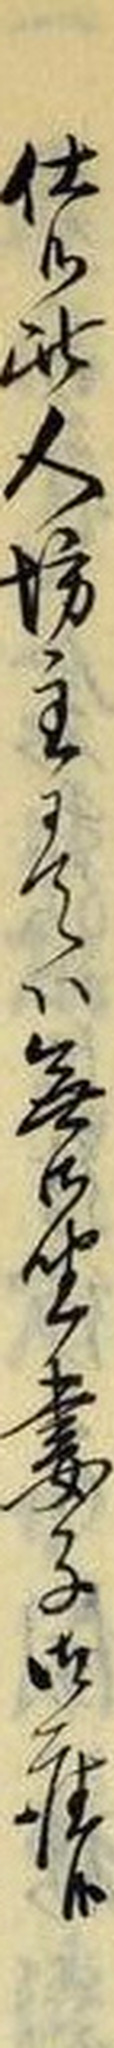仕候此人坊主にてハ無御座妻子御座候
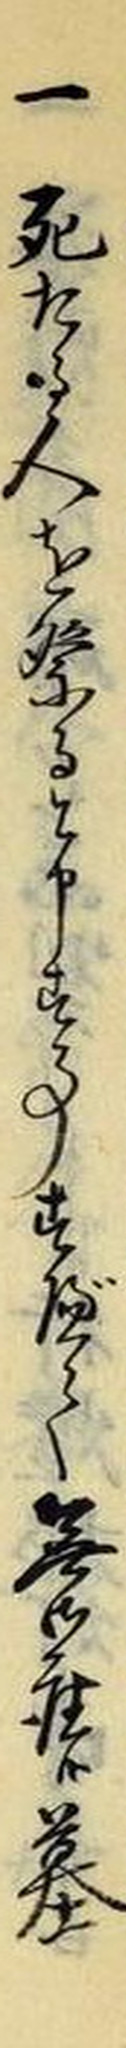一死たる人を祭ると申す事すべて無御座候墓
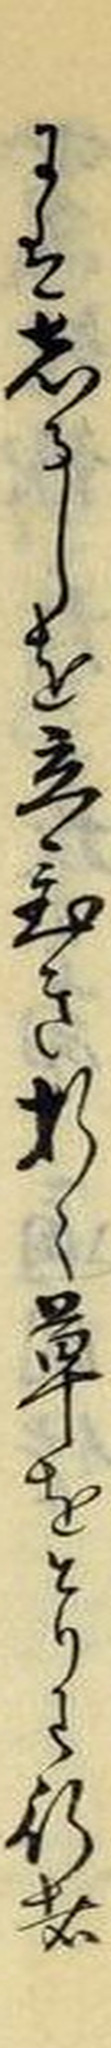にはしるしを立置き折々草をとりに行者
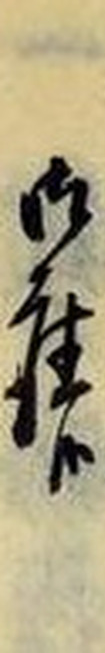御座候
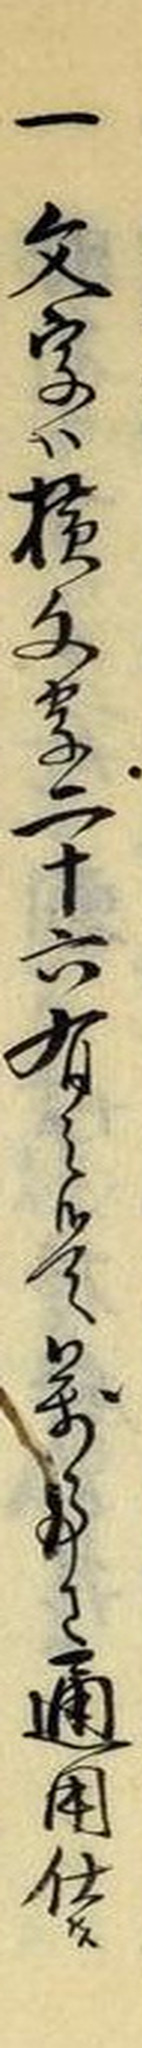文字ハ横文字二十六有之候て万事に通用仕候
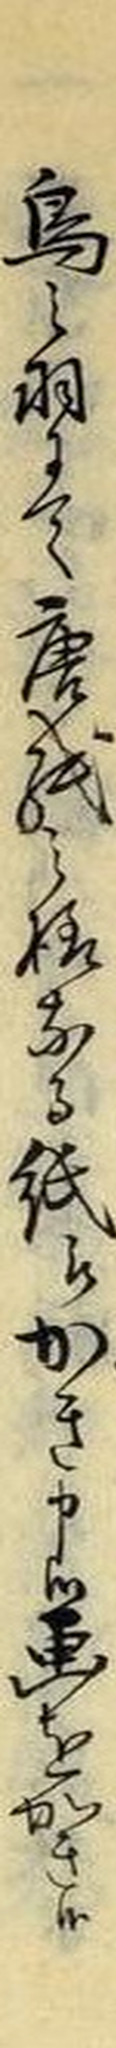鳥之羽にて唐紙之様なる紙江かき申候画をかき
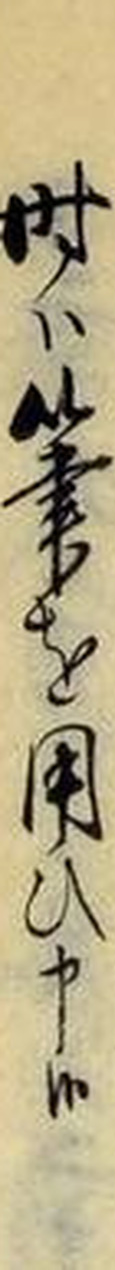時ハ筆を用ひ申候
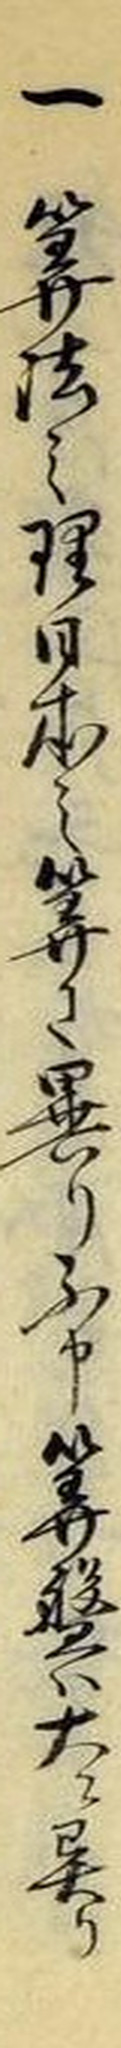一算法之理日本之算に異り不申算盤ハ大ニ異り
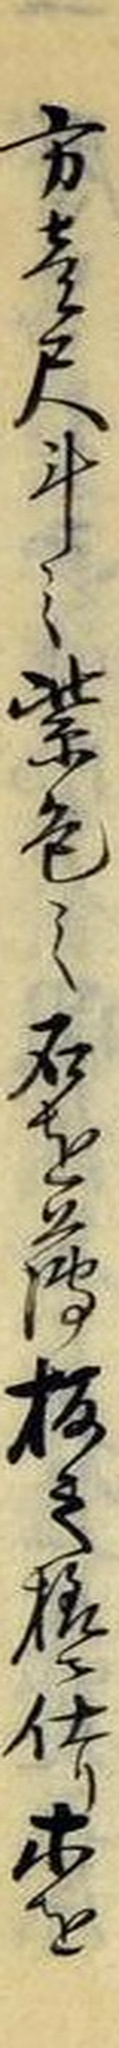方壱尺計之紫色之石を薄板之様ニ仕り木を
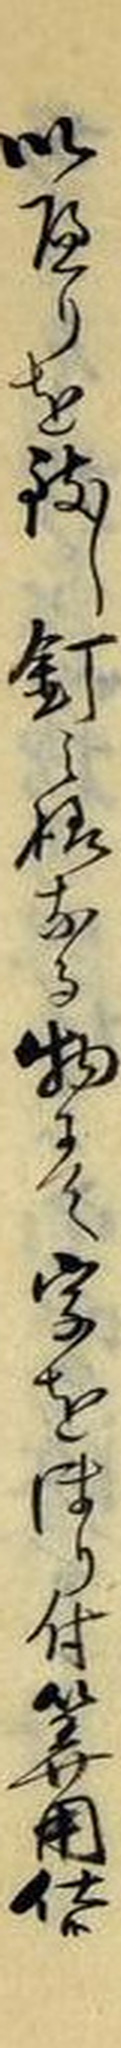此へりを致し釘之様なる物にて字をほり付算用仕候

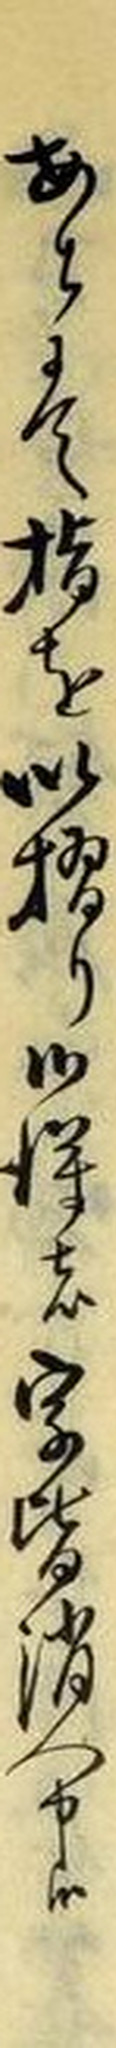あとにて指を以摺り候得者字皆消へ申候
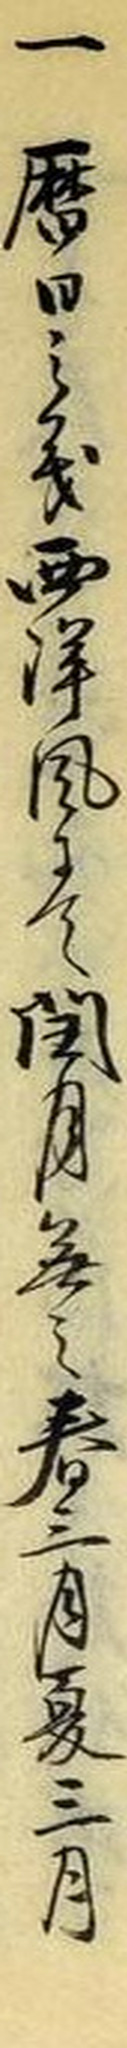一歴日之義西洋風にて閏月無之春三月夏三月
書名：漂客談奇（備考雑録写8）
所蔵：福井県文書館 Fukui Prefectural Archives
